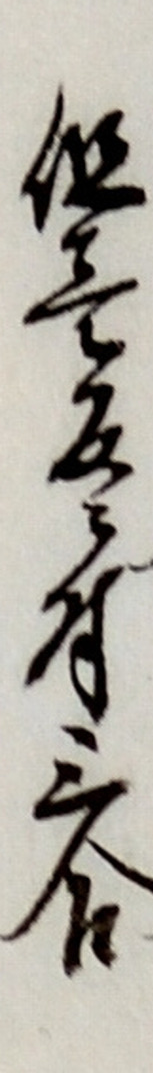但壱反ニ付三合
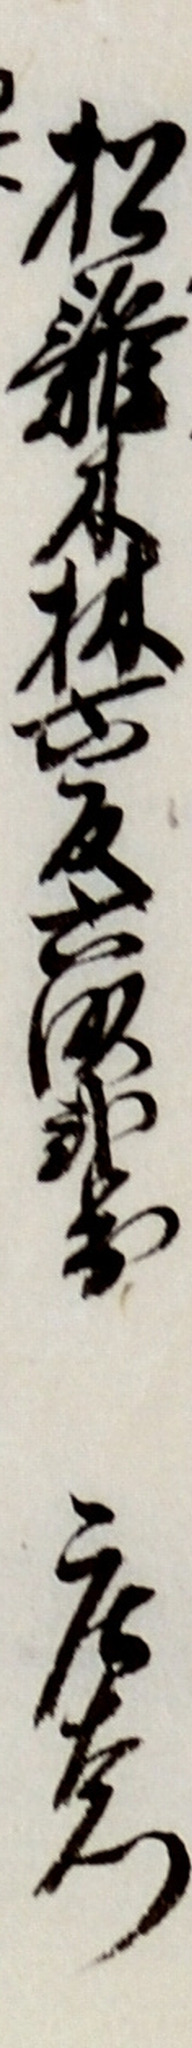松雑木林六反六畝弐歩庄右衛門
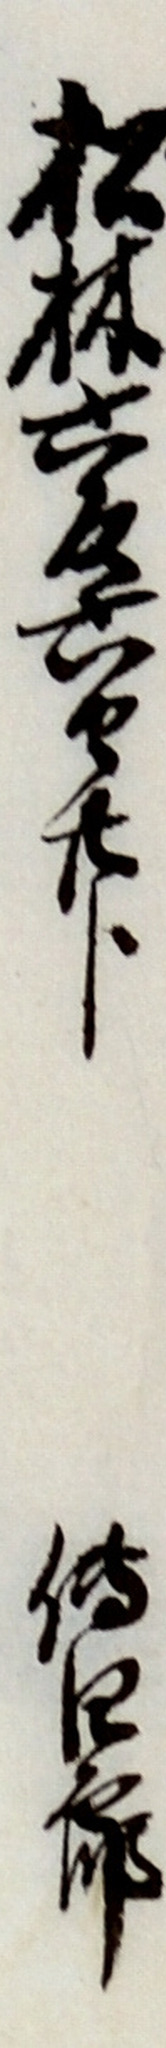松林六反六セ廿歩伝四郎
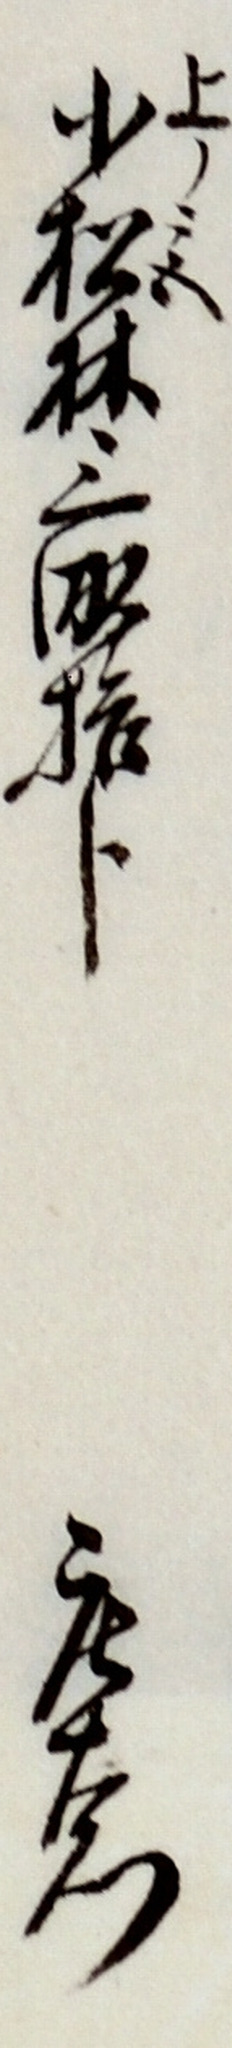小松林三畝拾歩庄右衛門
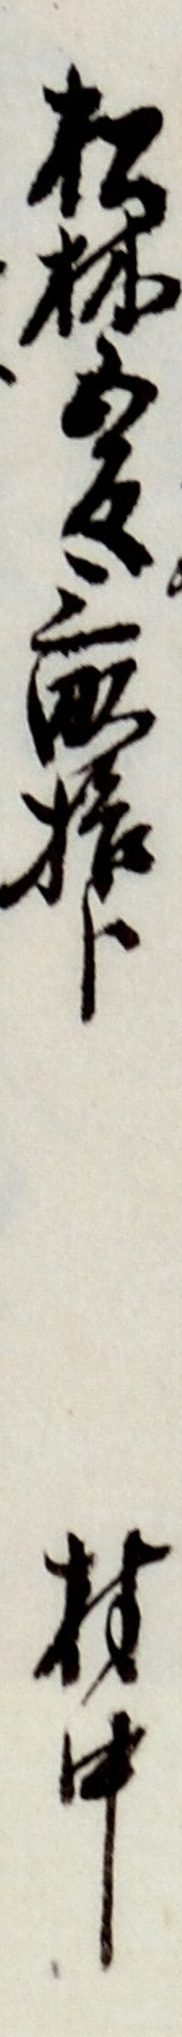松林五反三畝拾歩村中
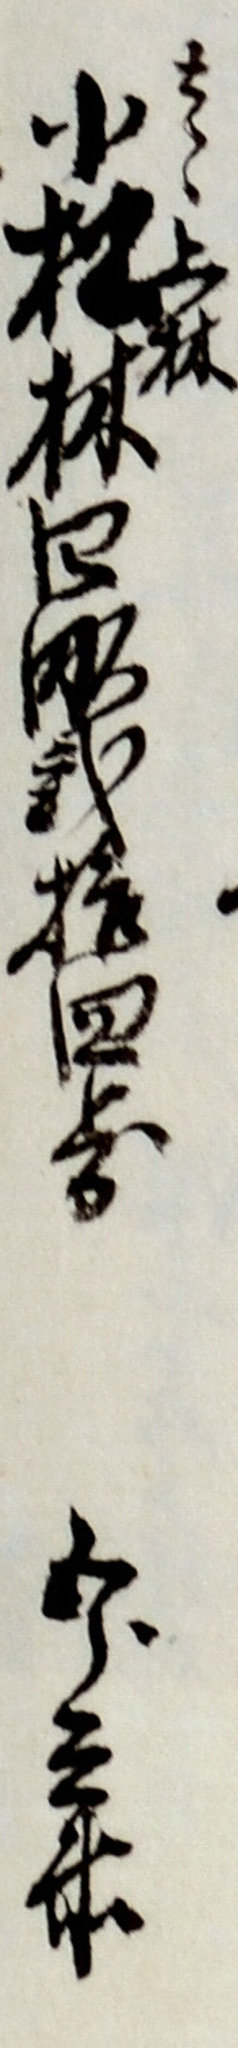小松林四畝弐拾四歩五郎兵衛
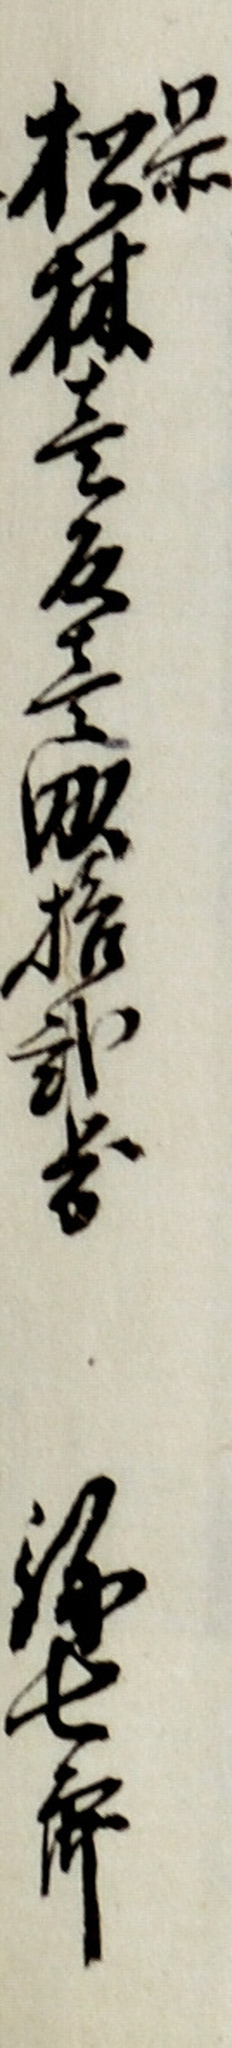松林壱反壱畝拾弐歩弥七郎
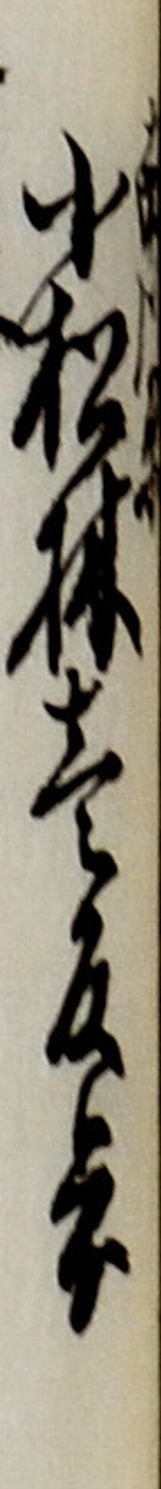小松林壱反歩千松
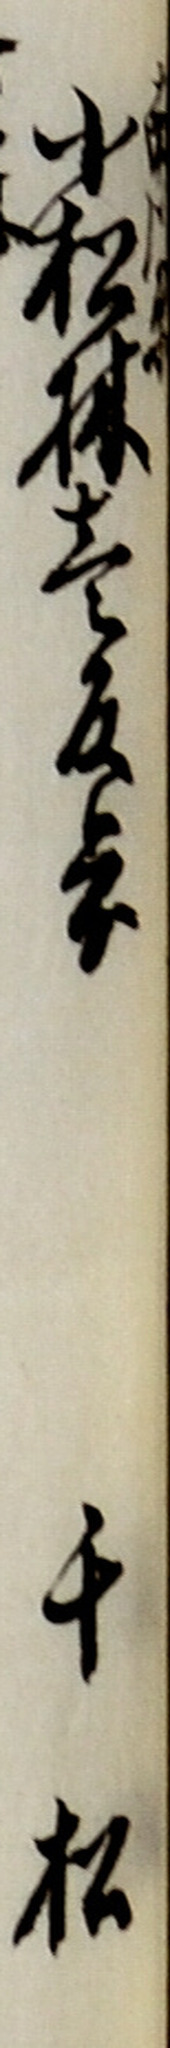小松林壱反歩千松
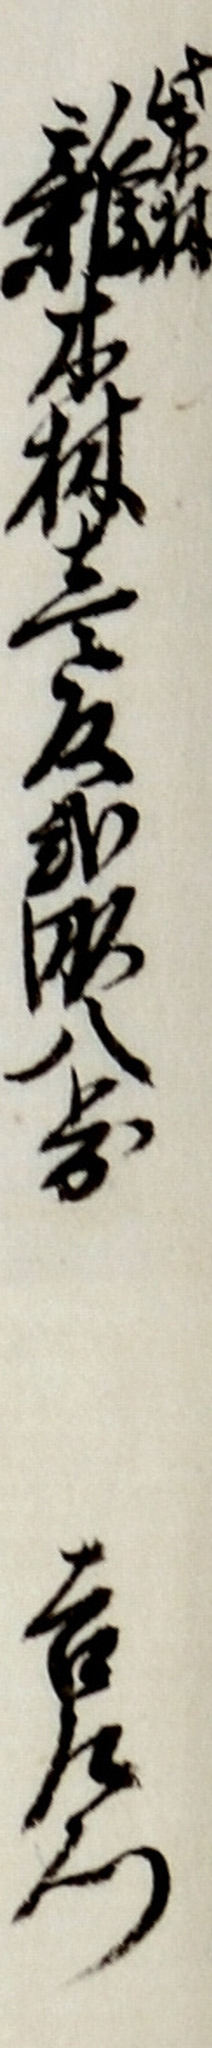雑木林壱反弐畝八歩吉左衛門
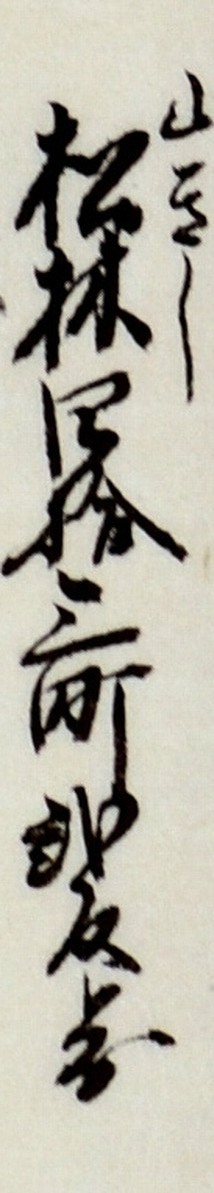松林四拾三町弐反歩村中
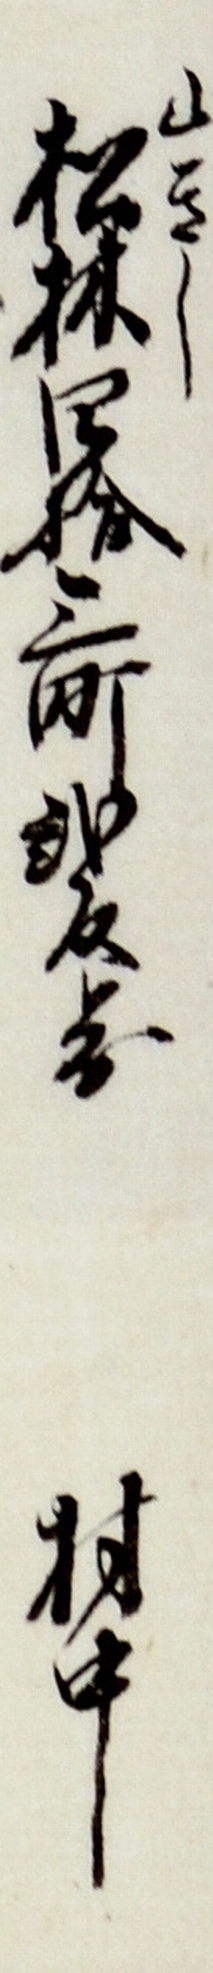松林四拾三町弐反歩村中
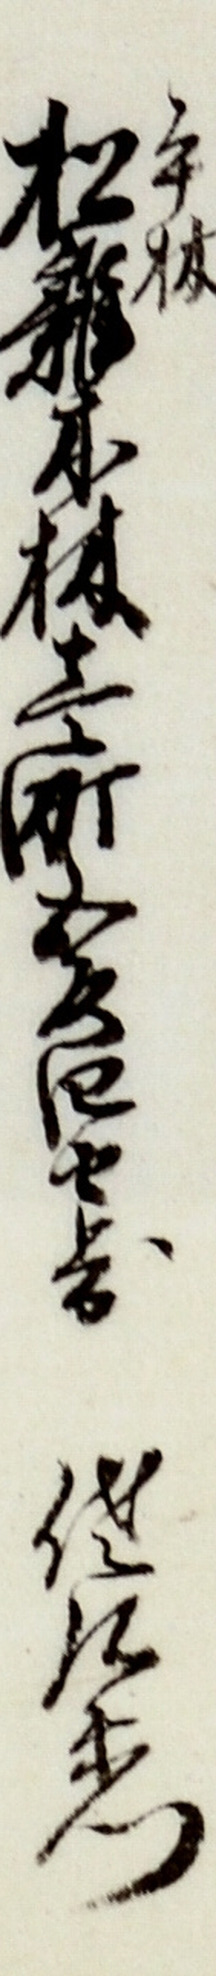松雑木林壱町五反四セ歩佐左衛門
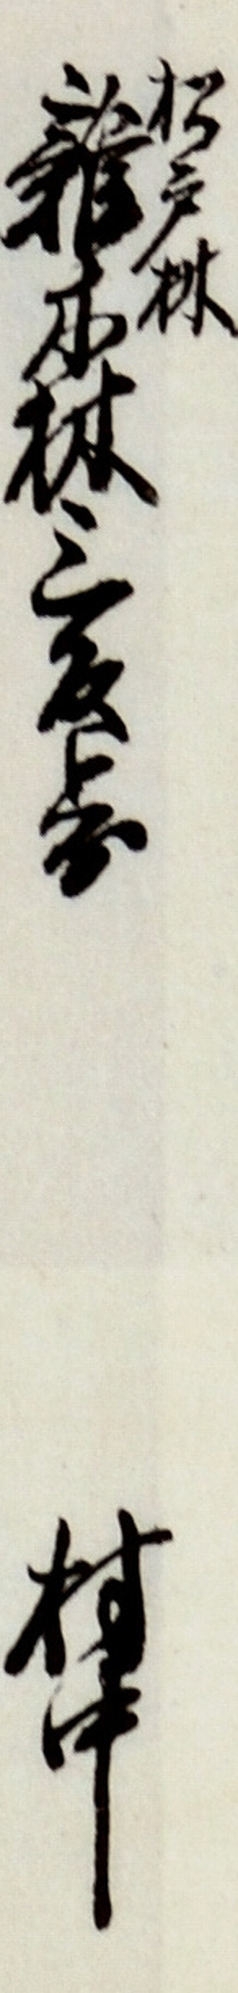雑木林三反歩村中
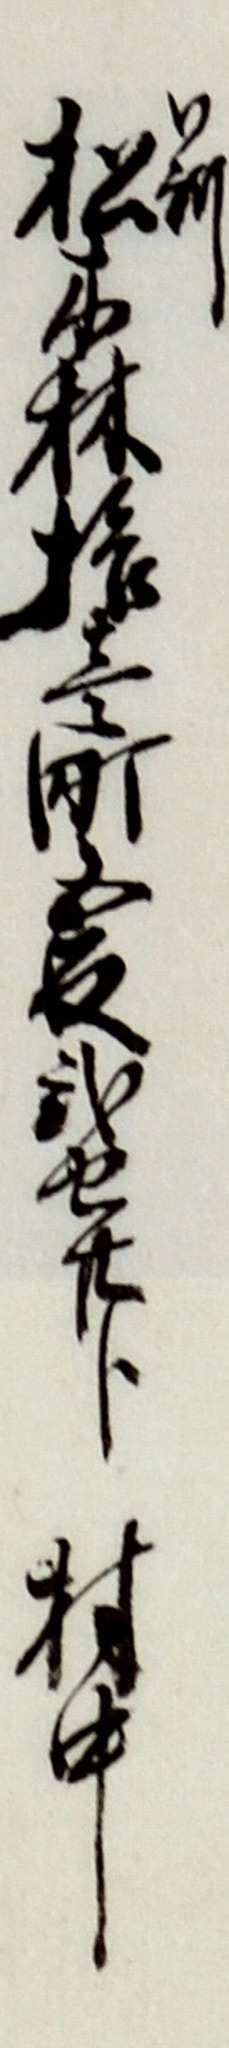松木林拾壱町五反弐セ廿歩村中
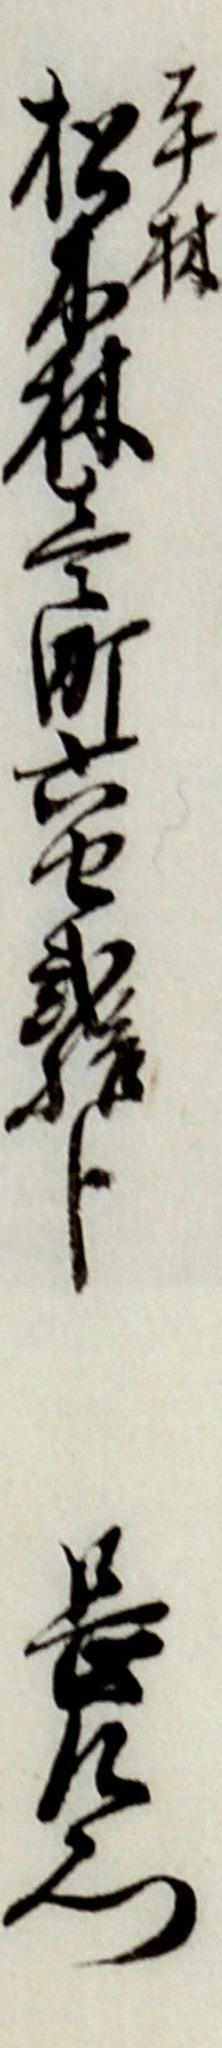松木林壱町六セ弐拾歩長左衛門
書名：御領分中山林社地手控
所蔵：伊那市立高遠町図書館・合同会社AMANE
